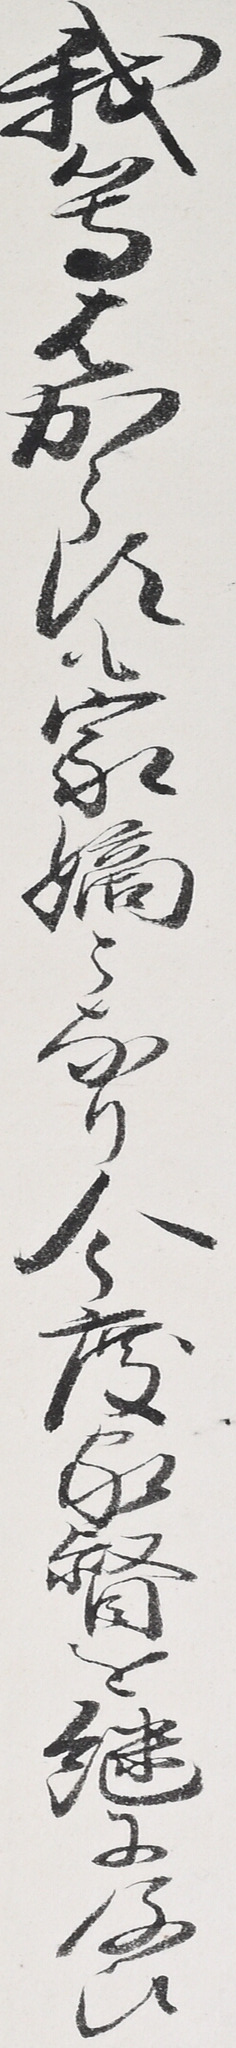我等はからすも家嫡となり今度家督を継に及ひ
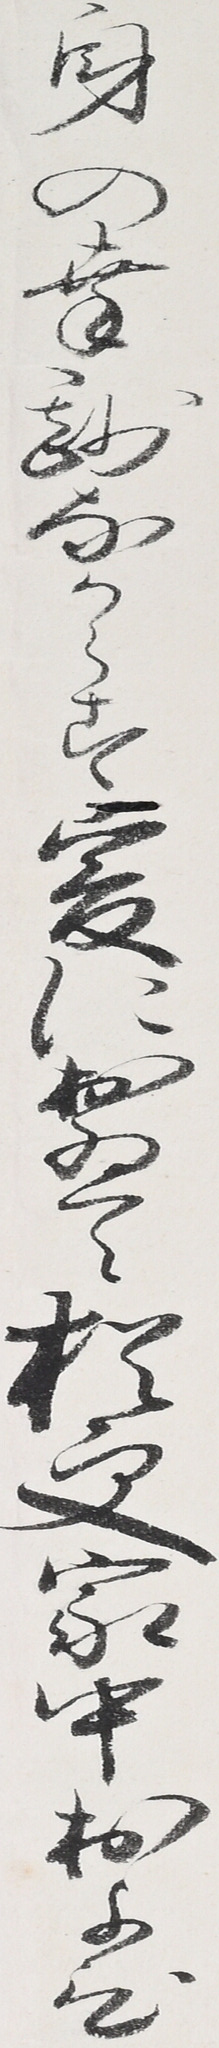身の幸尠なからす爰におゐて猶更家中およひ
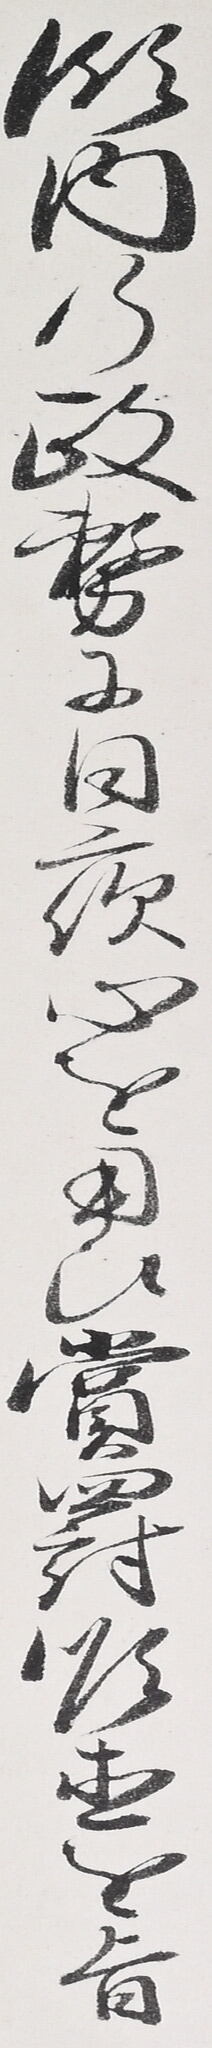領内の改務に日夜心を用ひ賞罰順直を旨
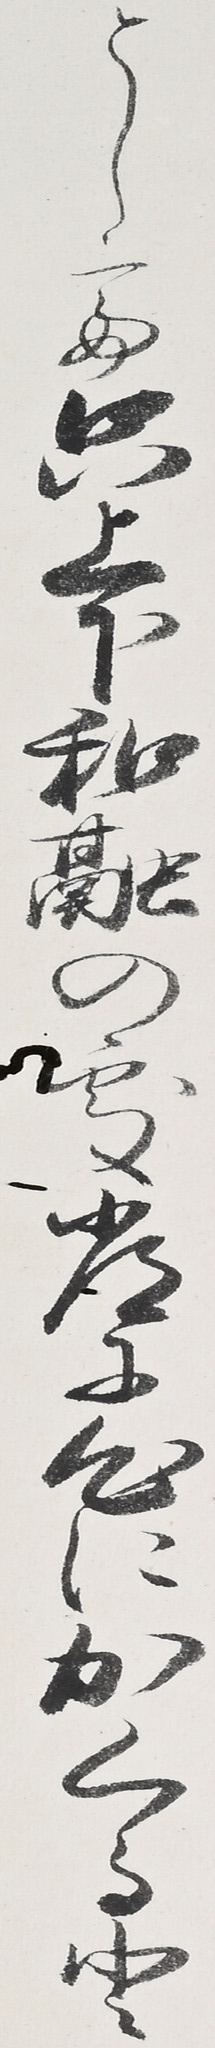として只上下和融の処常に心にかくると
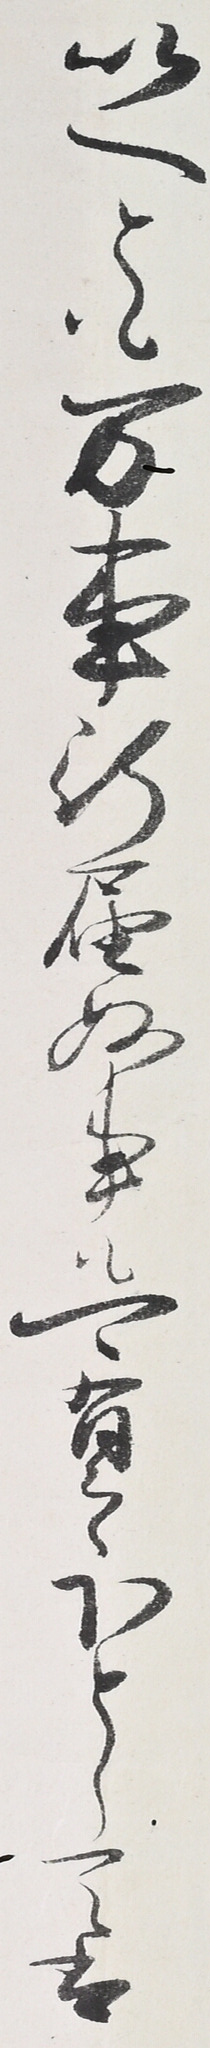いへとも万事行届ぬ事も可有之下としては
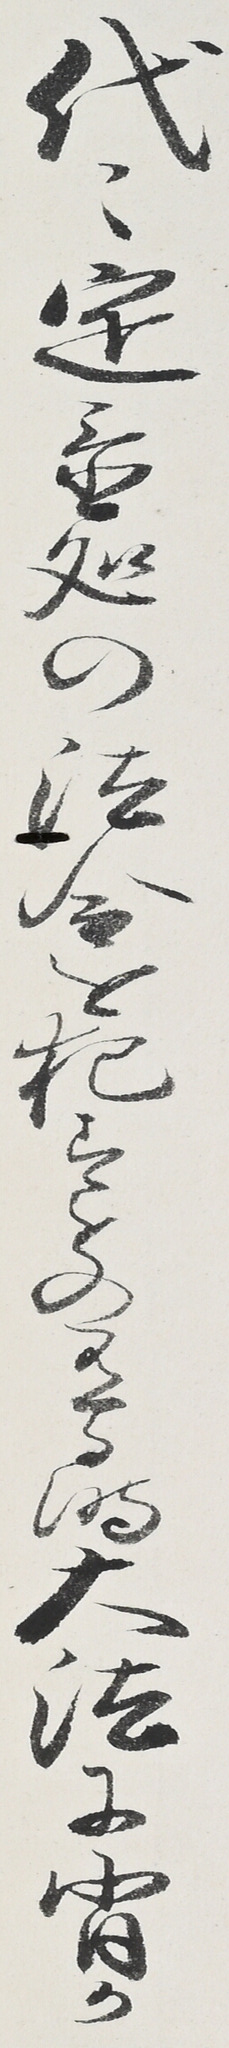代々定置処の法令を犯すもの有る時大法に背か
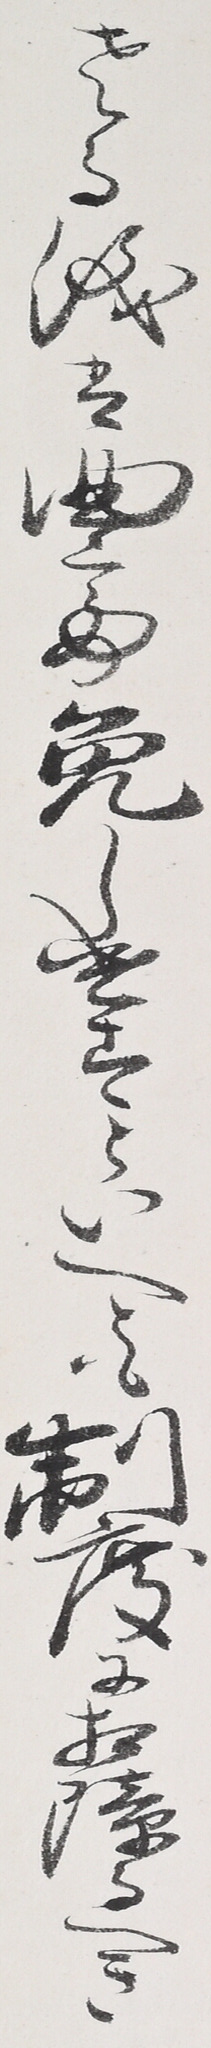さる儀は曲て免し遣すといへとも制度に相障るへき
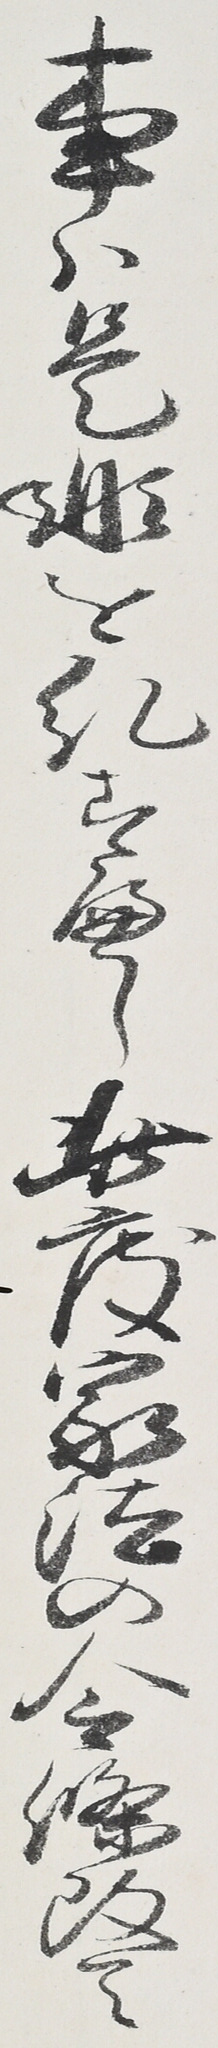事ハ是非を糺すへし此度家法の令條改て
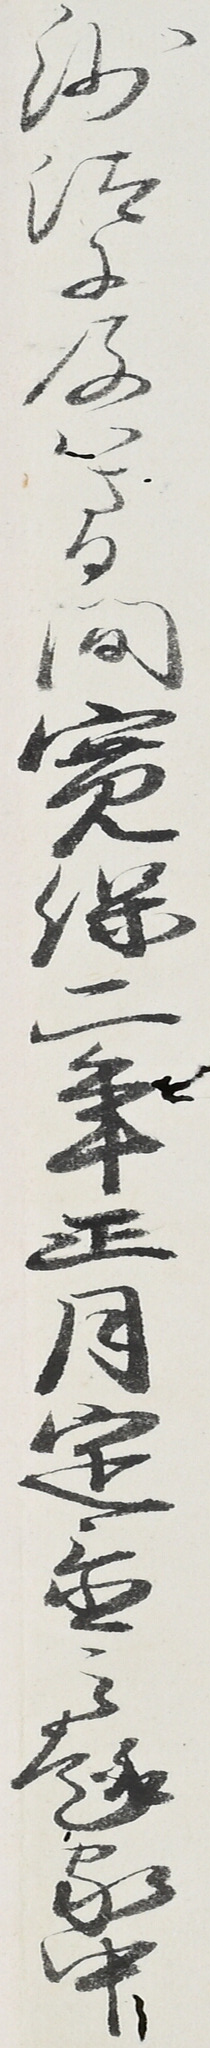沙汰に及さる間寛保二年正月定置之趣家中
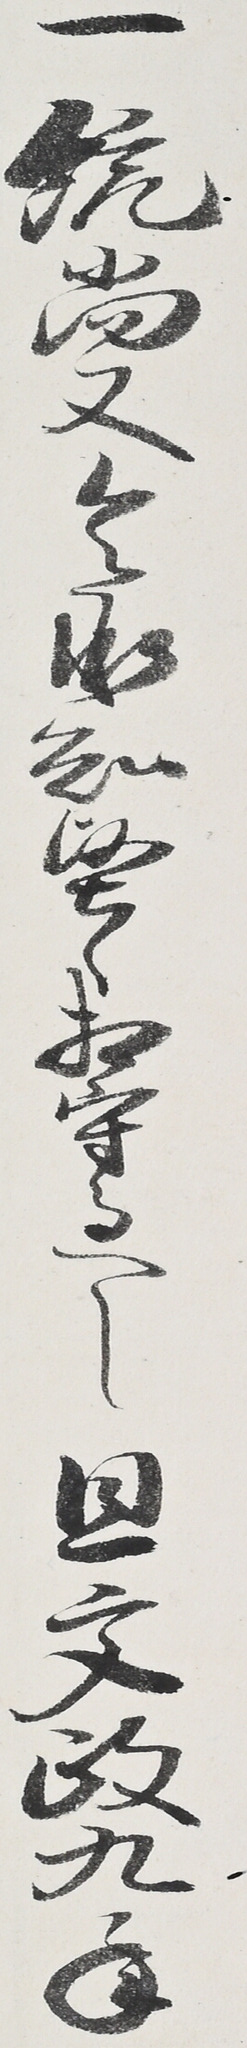一統尚又令承知堅く相守るへし且文政九年
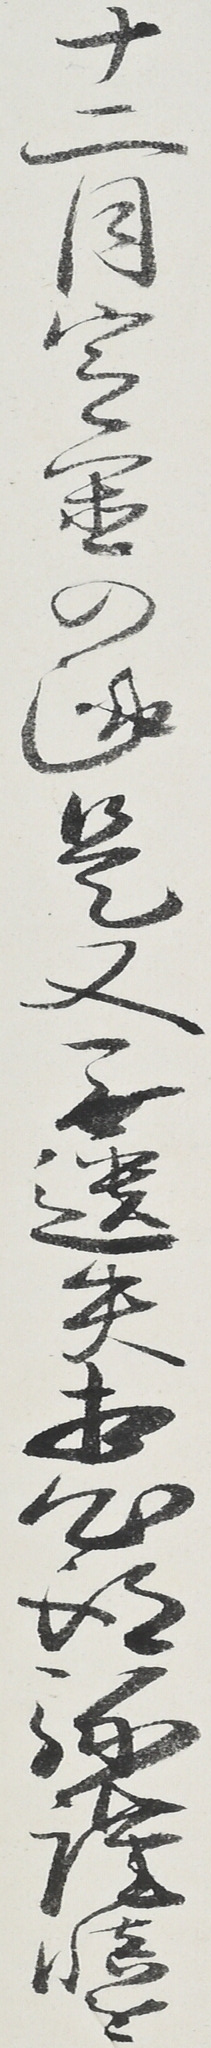十二月定置の趣是又不遺失相心得弥謹慎を
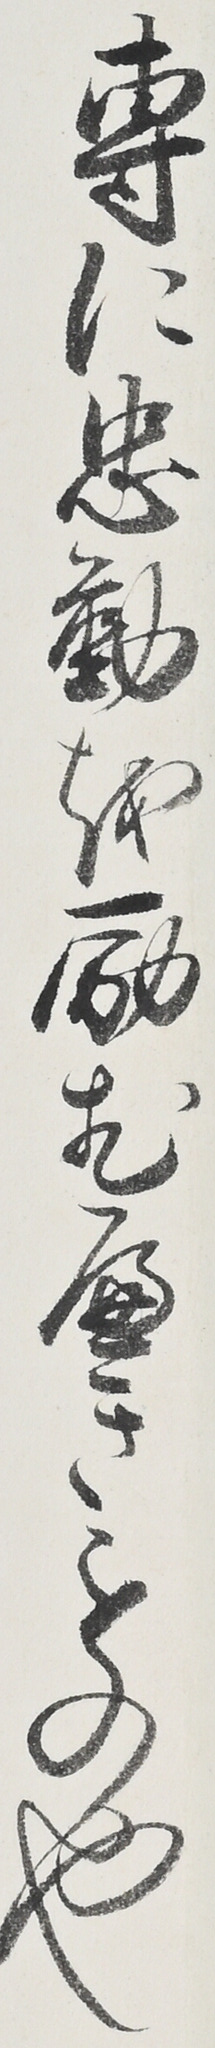専に忠勤を励むへきもの也
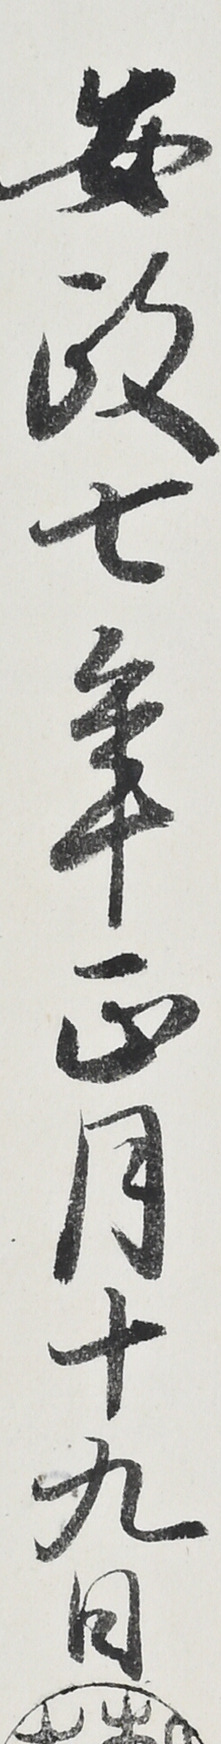安政七年正月十九日
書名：御添書
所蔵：伊那市立高遠町図書館・合同会社AMANE
